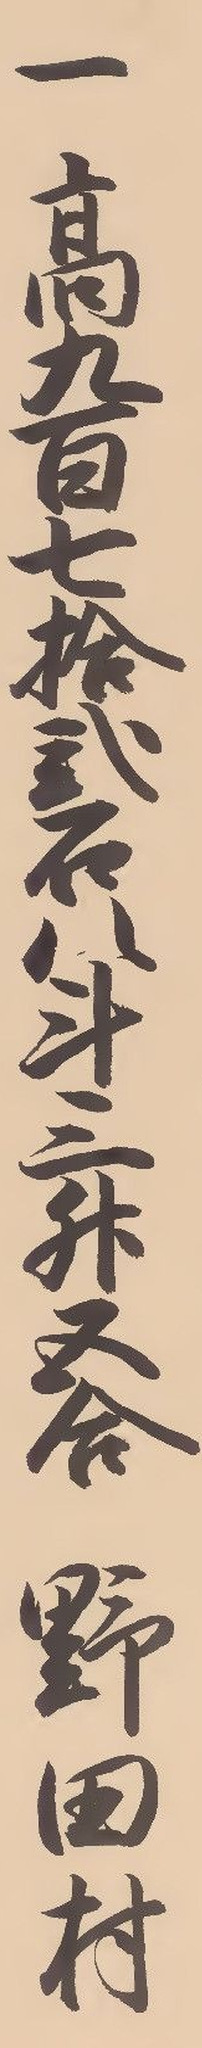一髙九百七拾弐石八斗三升五合野田村
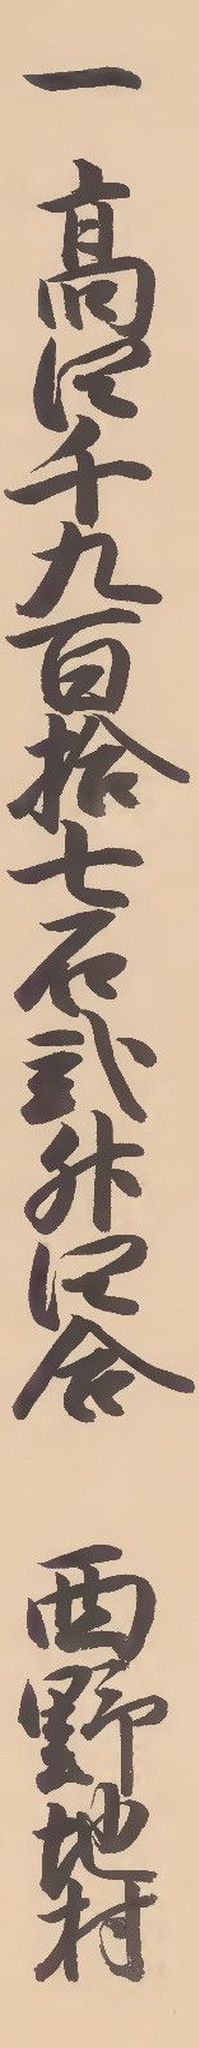一髙四千九百拾七石弐升四合西野地村

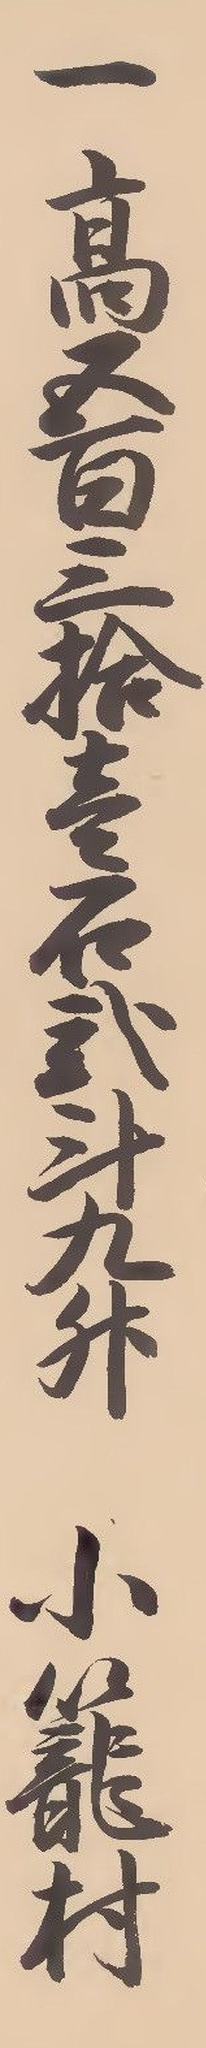一髙五百三拾壱石弐斗九升小籠村
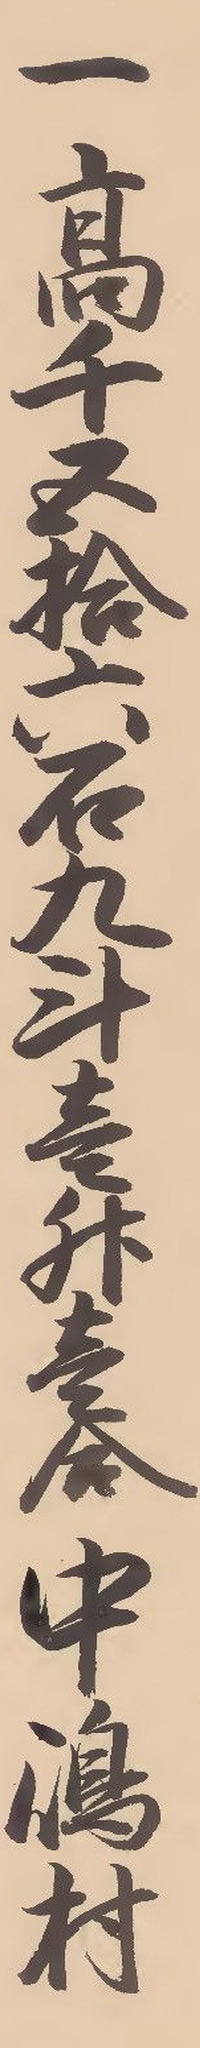一髙千五拾六石九斗壱升壱合中嶋村
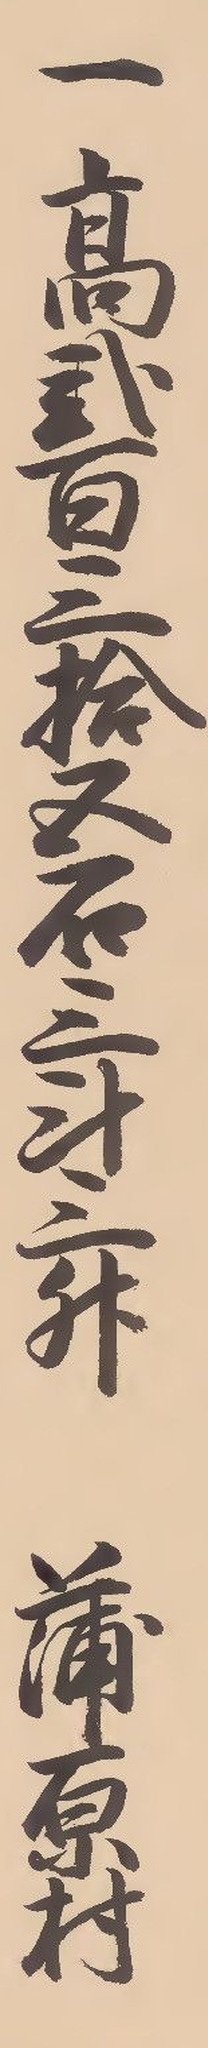一髙弐百三拾五石三斗三升蒲原村
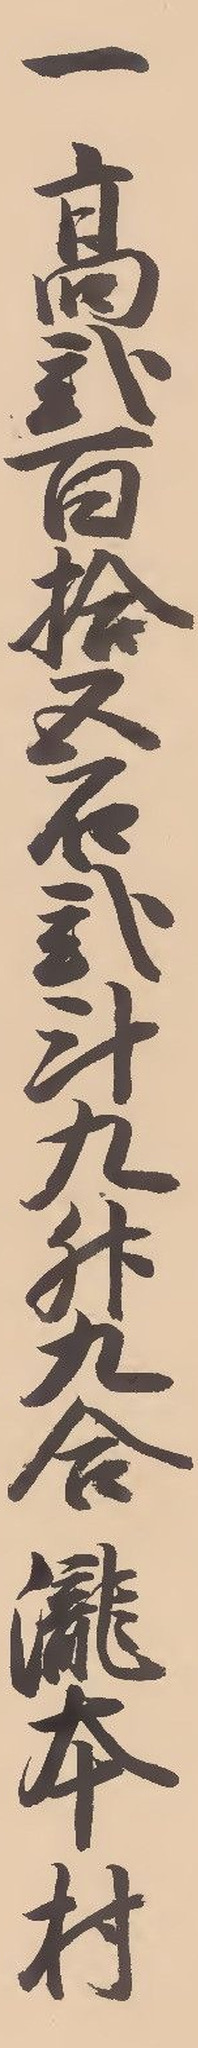一髙弐百拾五石弐斗九升九合瀧本村
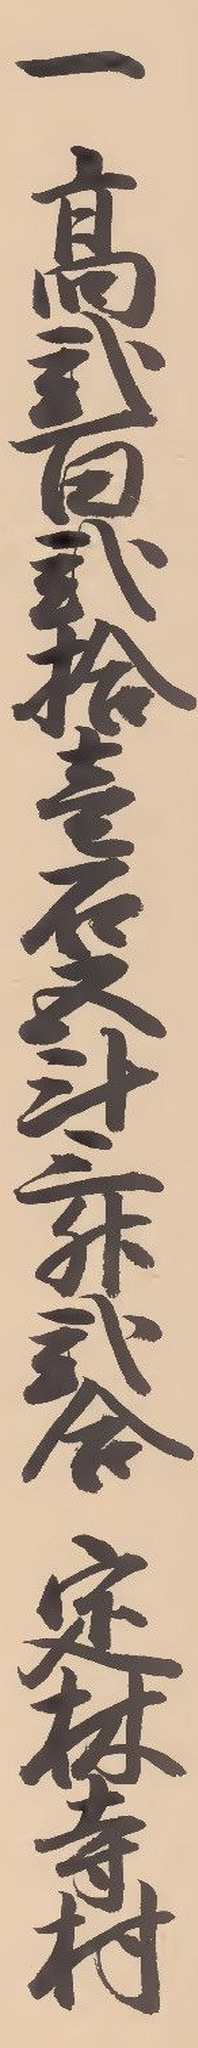一髙弐百弐拾壱石五斗三升弐合定林寺村
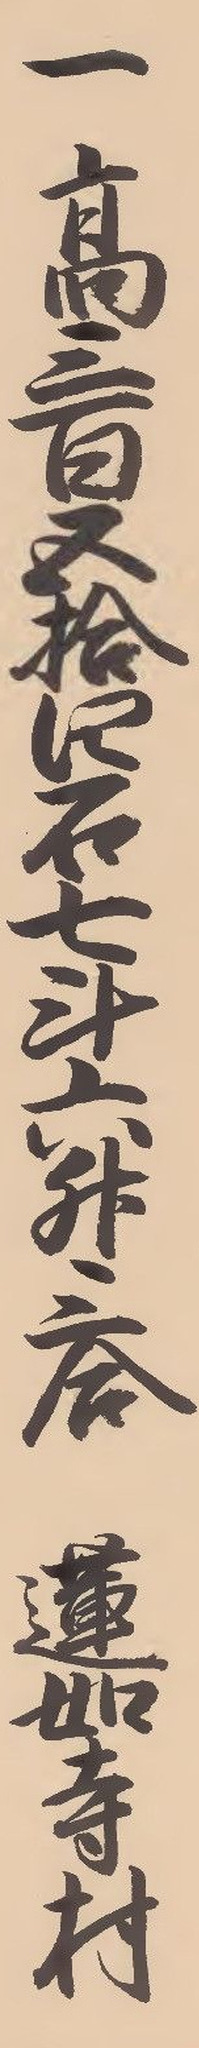一髙三百五拾四石七斗六升三合蓮如寺村
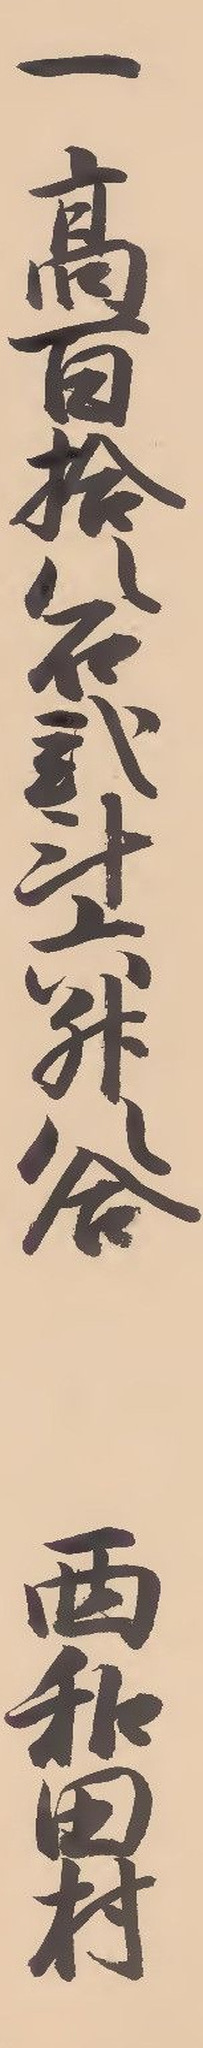一髙百拾八石弐斗六升八合西和田村

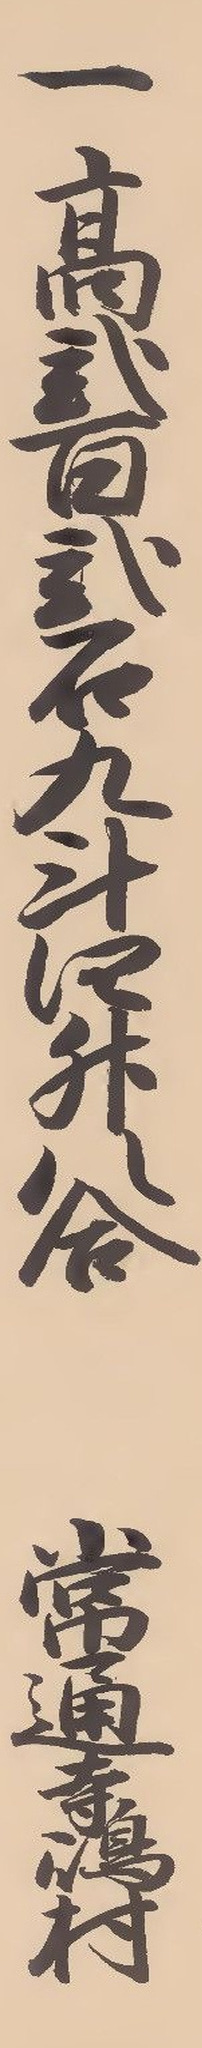一髙弐百弐石九斗四升八合常通寺嶋村
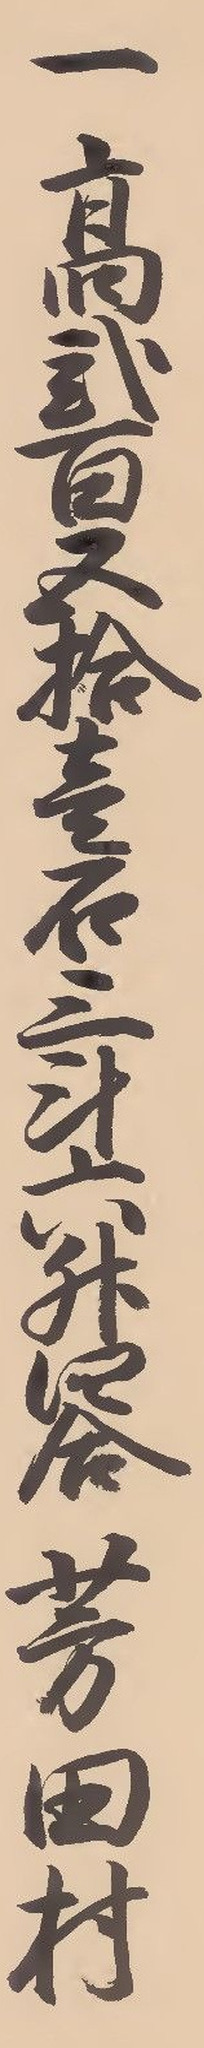一髙弐百五拾壱石三斗六升四合芳田村
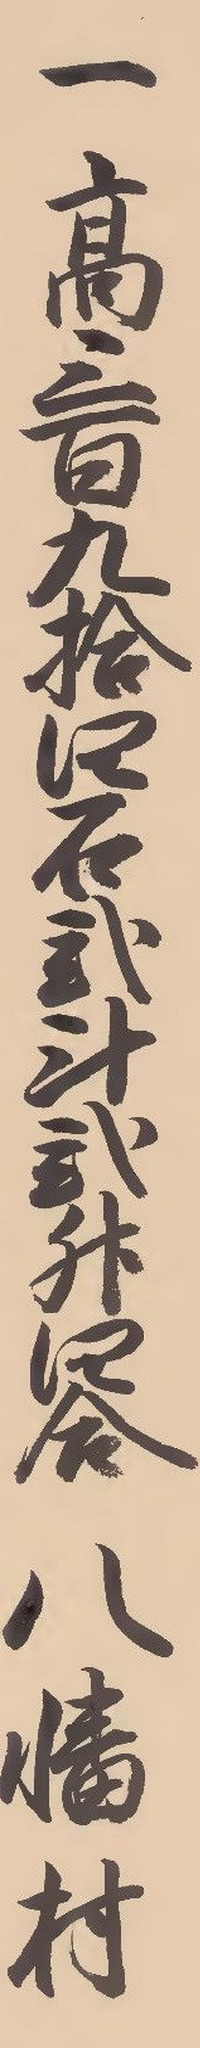一髙三百九拾四石弐斗弐升四合八幡村
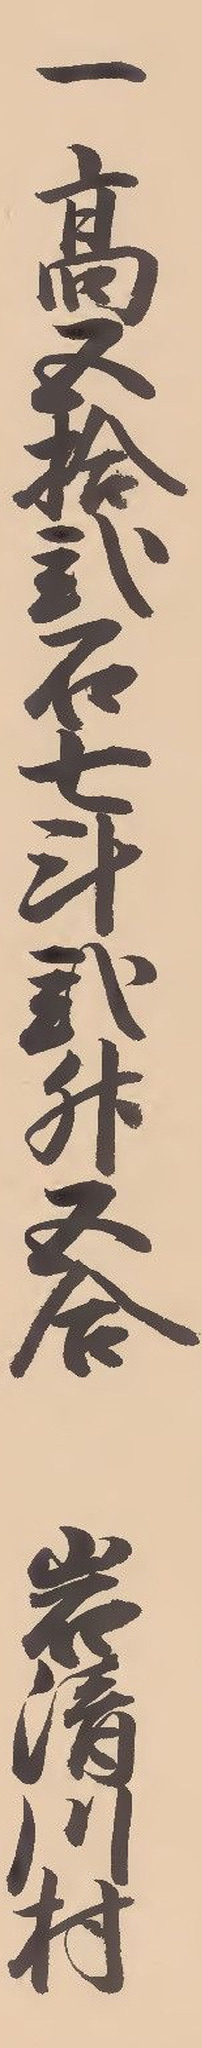一髙五拾弐石七斗弐升五合岩清川村
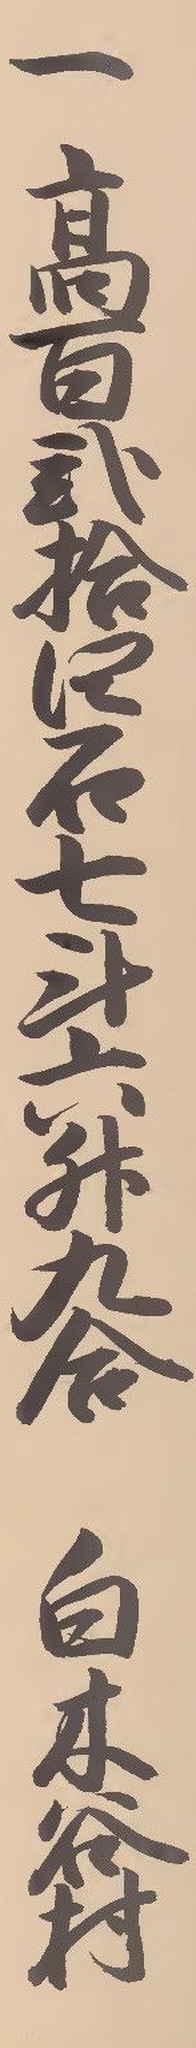一髙百弐拾四石七斗六升九合白木谷村
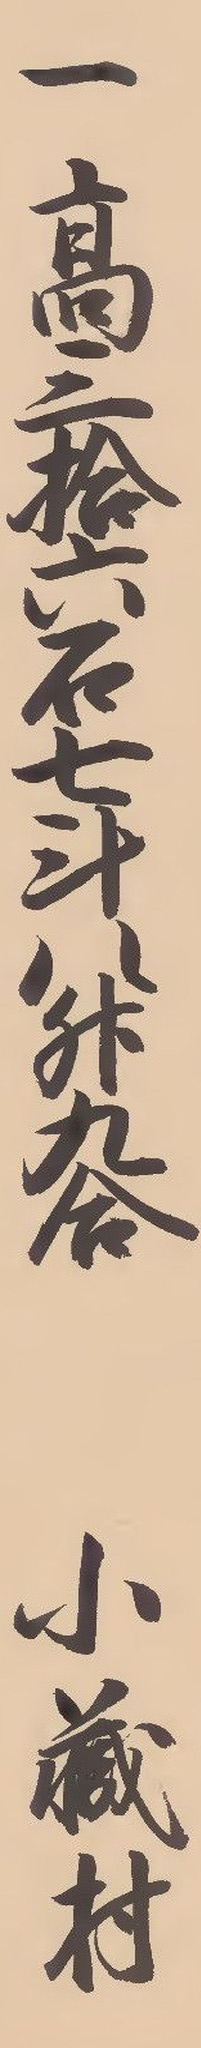一髙三拾六石七斗八升九合小藏村
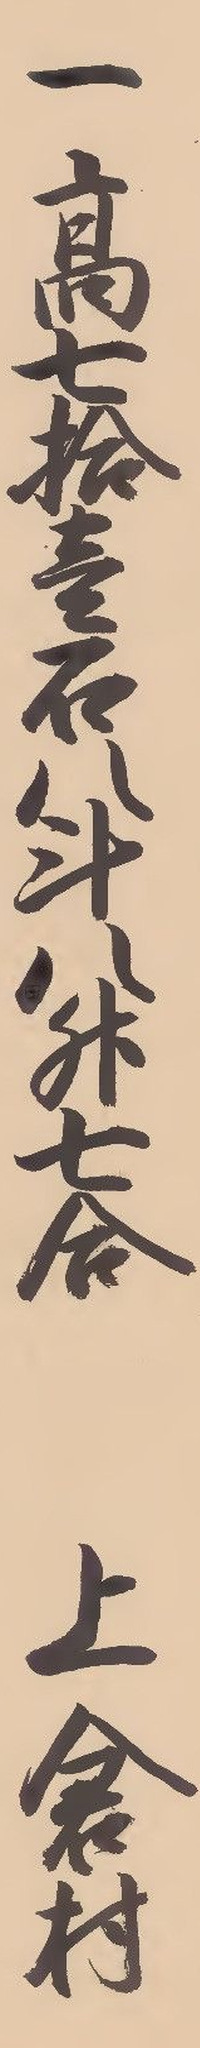一髙七拾壱石八斗八升七合上倉村
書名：土佐国郷帳
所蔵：国立公文書館 National Archives of Japan
